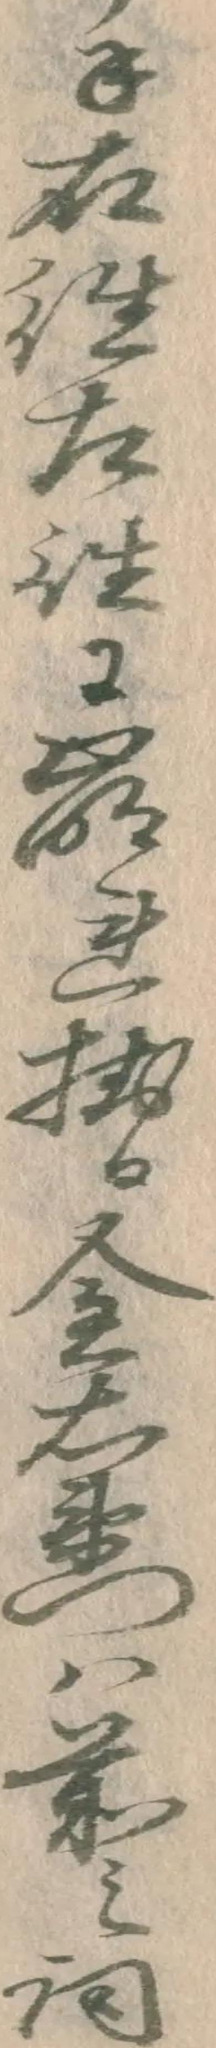手右往左往尓崩連掛る金右衛門は前之詞
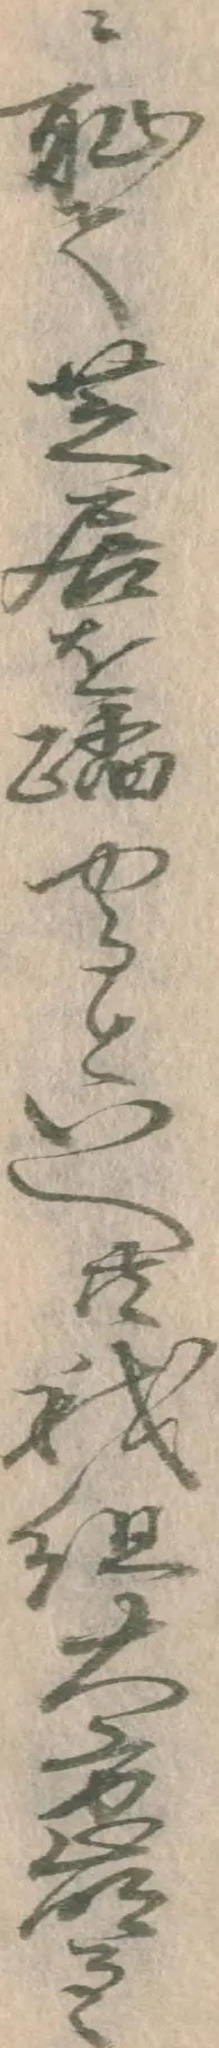に恥て芝居を踏やるといへ共我組大方崩るゝ
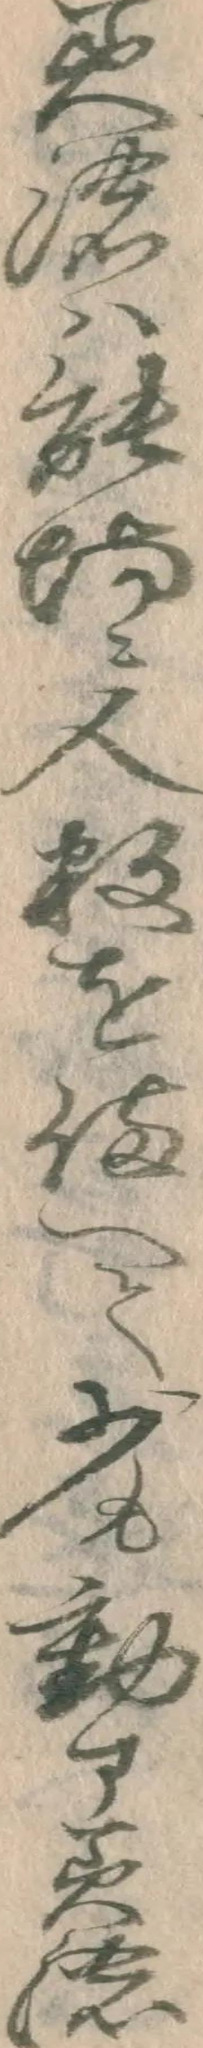美濃は能場に人数を備へて少も動す美濃
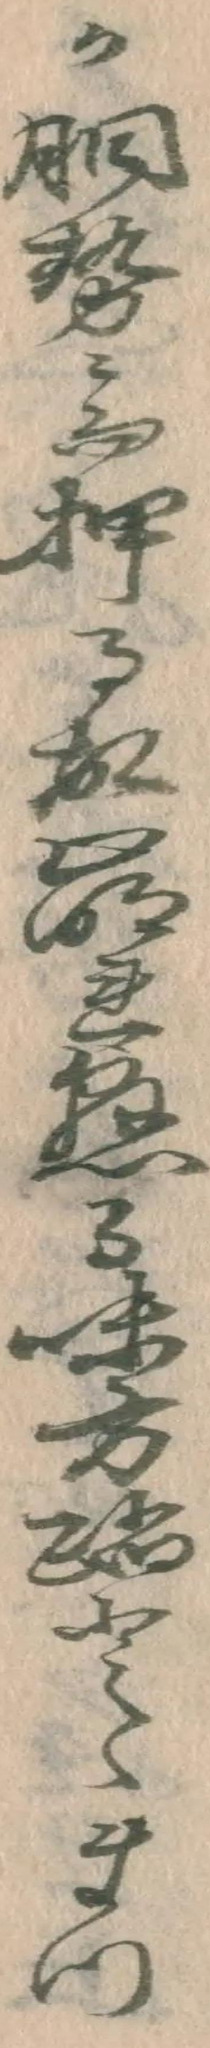か胴勢に而押る故崩連懸る味方踏登々ま川
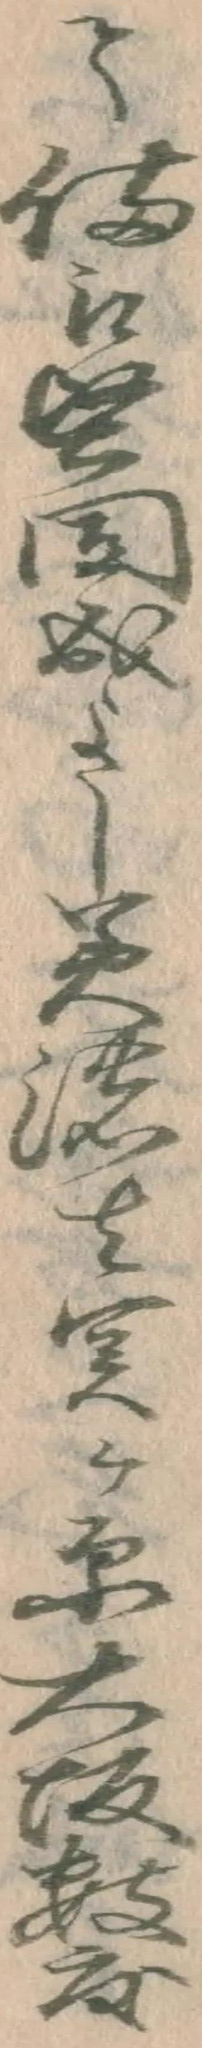て備江堅固成よし美濃者関け原大坂数度
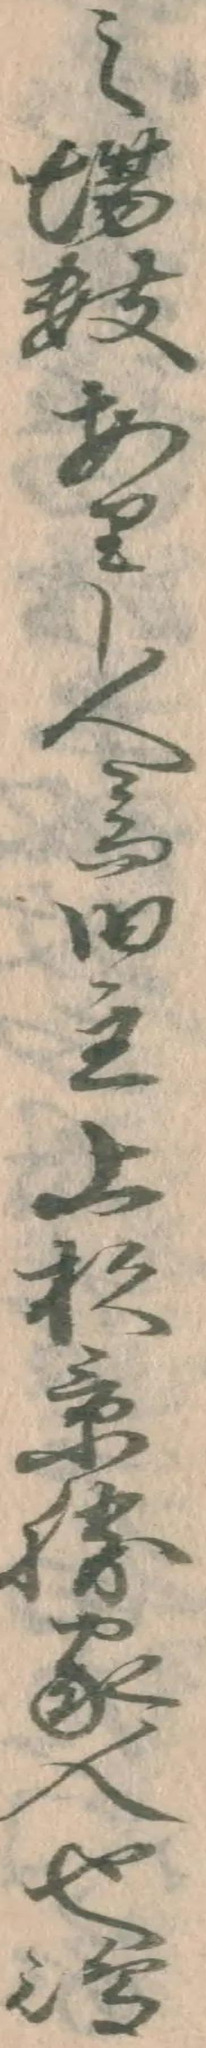之場数あ里し人に而旧主上杉景勝家人也島
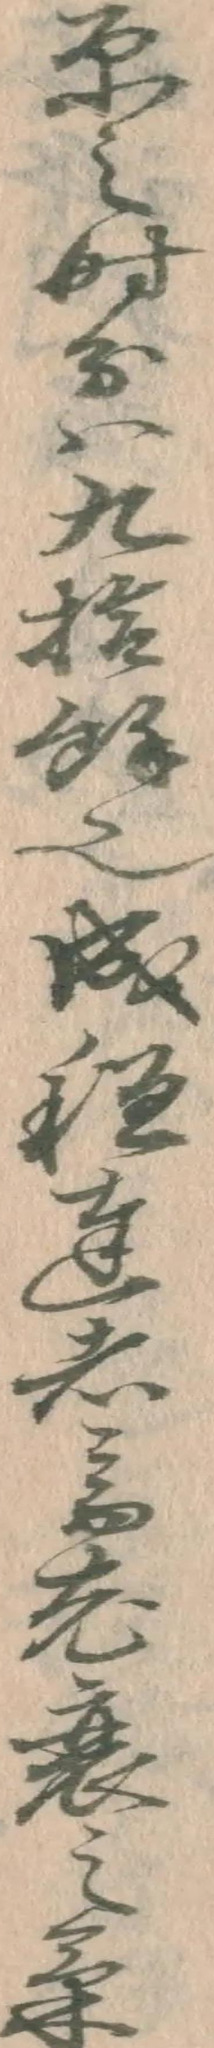原之時分は九拾余也成程達者に而老衰之気
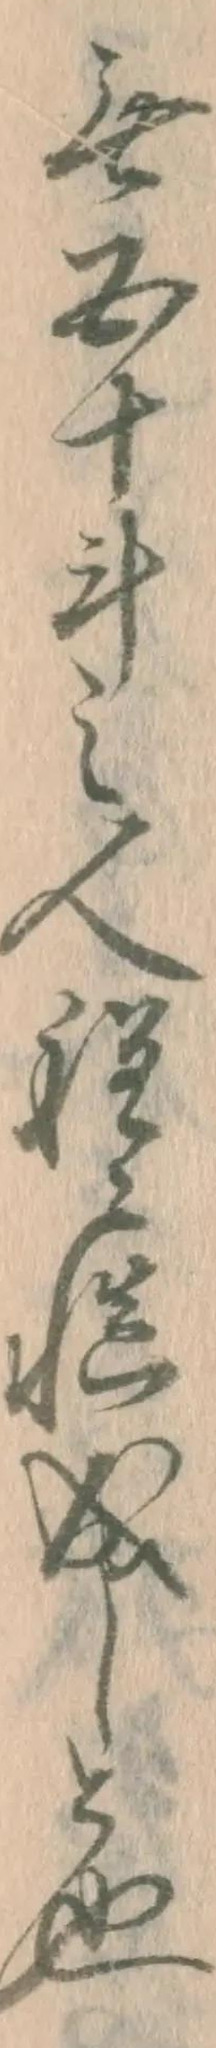無五十斗之人程に慥成しと也
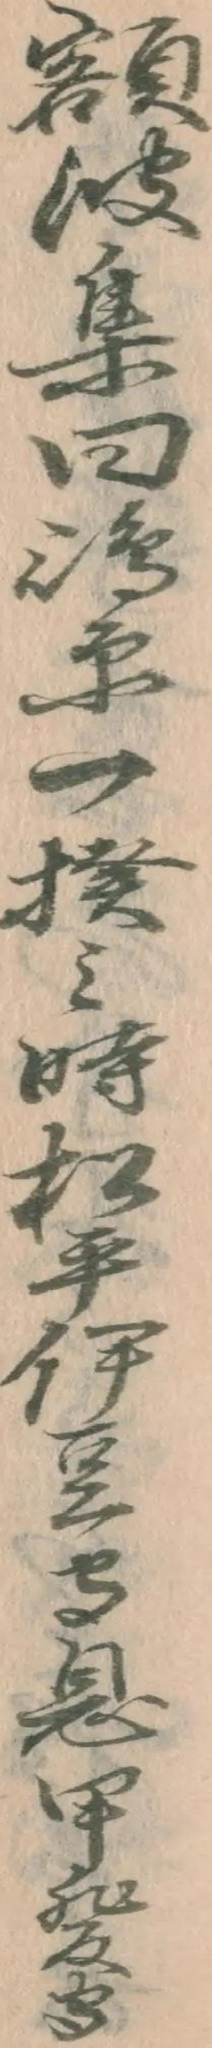額波集曰島原一揆之時松平伊豆守息甲斐守
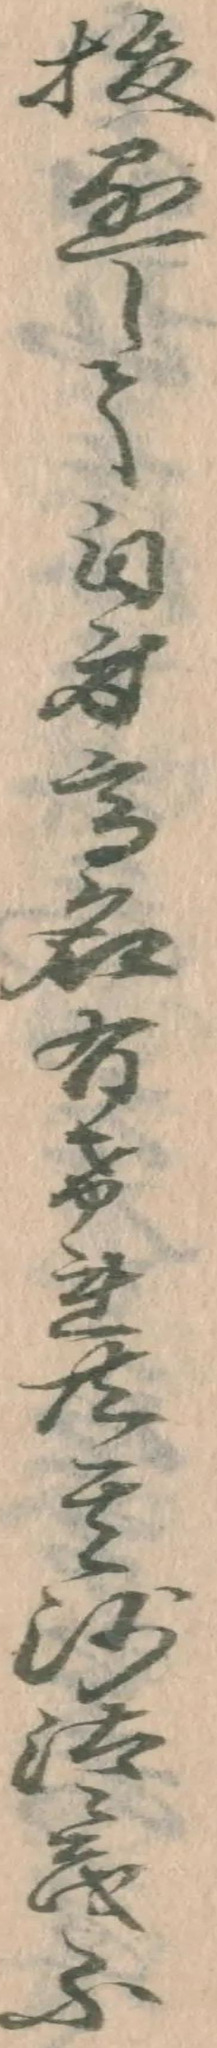抜懸して而進高名有希連共其沙汰に茂ふ
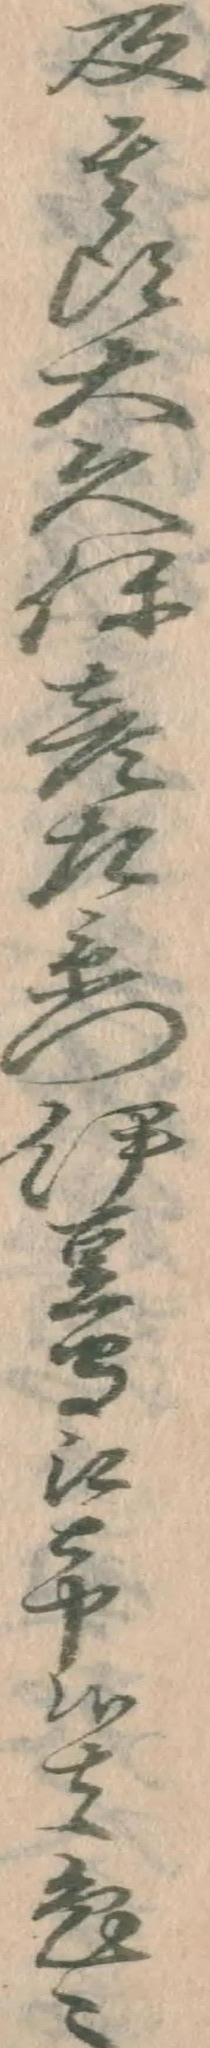及其頃大久保彦左衛門伊豆守江被申候者色々
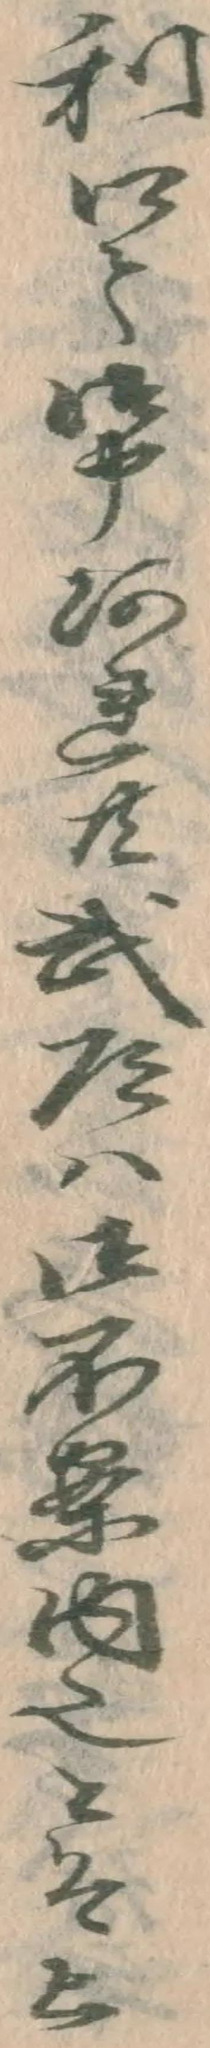利口て御申阿連共武道は御不案内也とそ被
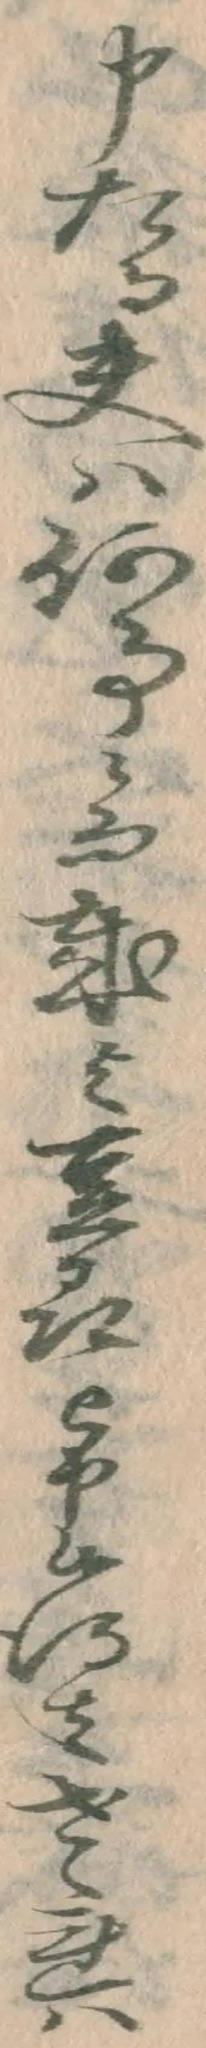申たる夫は何事に而成与豆州被申候得者さ連は
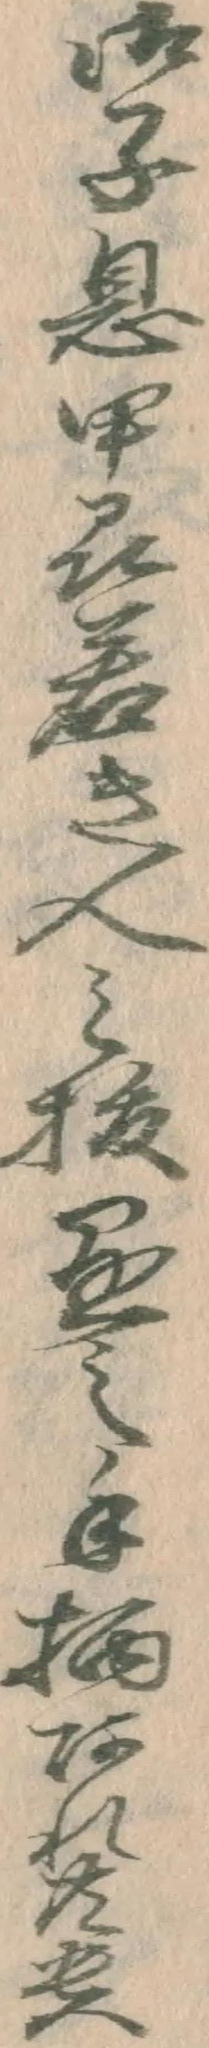御子息甲州若き人之抜懸之手柄阿れ共貴
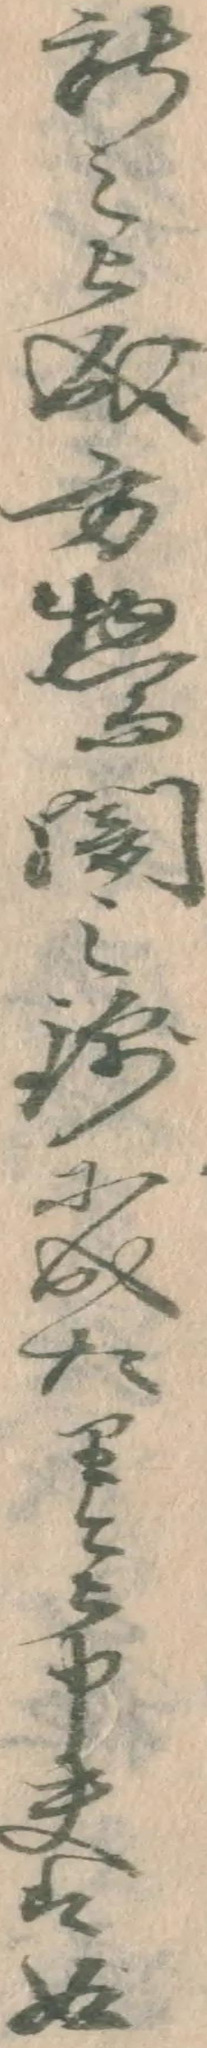所之被成方惣而闇之錦尓成た里と被申夫盤如
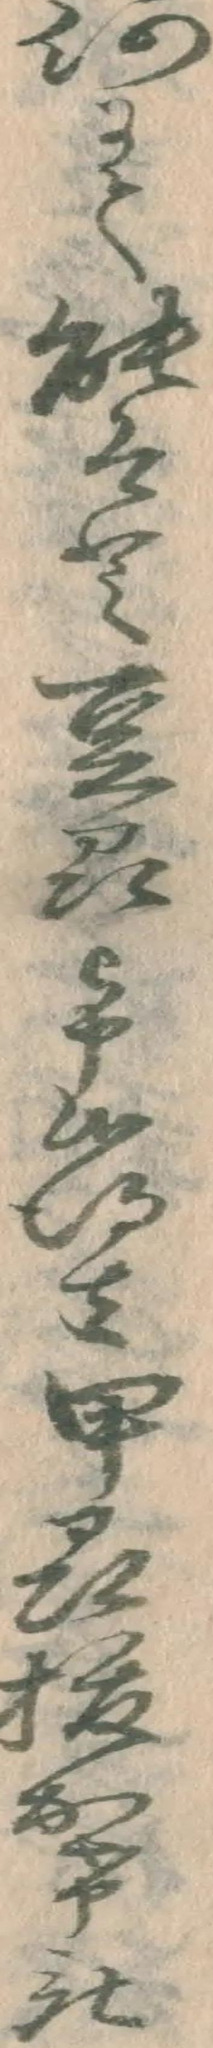何尓て能そ登豆州被申候得者甲州抜か希被
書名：切支丹御退治記 49巻. [8]
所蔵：国立国会図書館 National Diet Library, JAPAN
